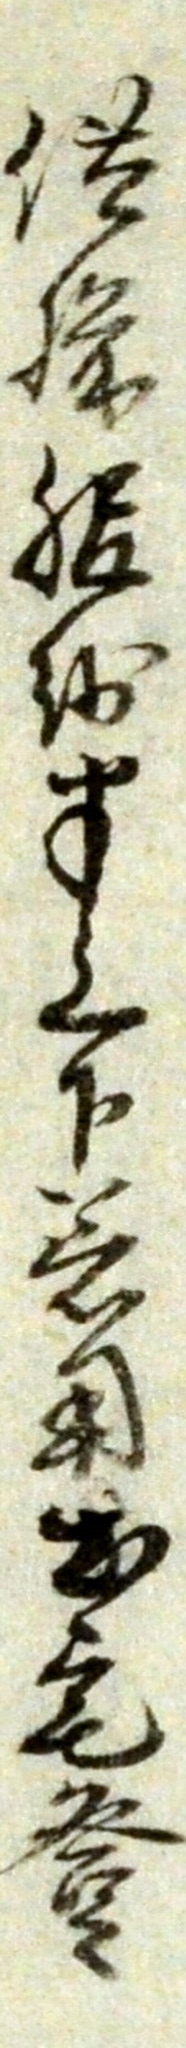供揃服紗半上下着用出宅登
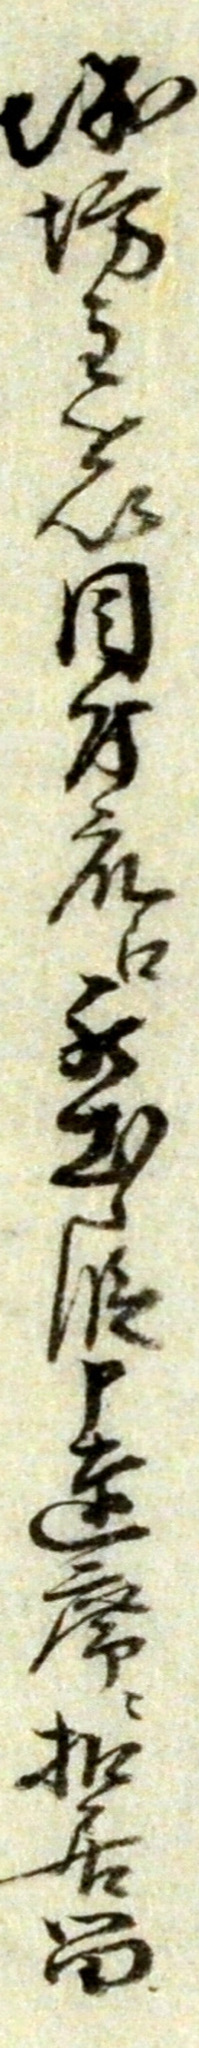城坊主を以目付衆江罷出候段申達席ニ扣居留
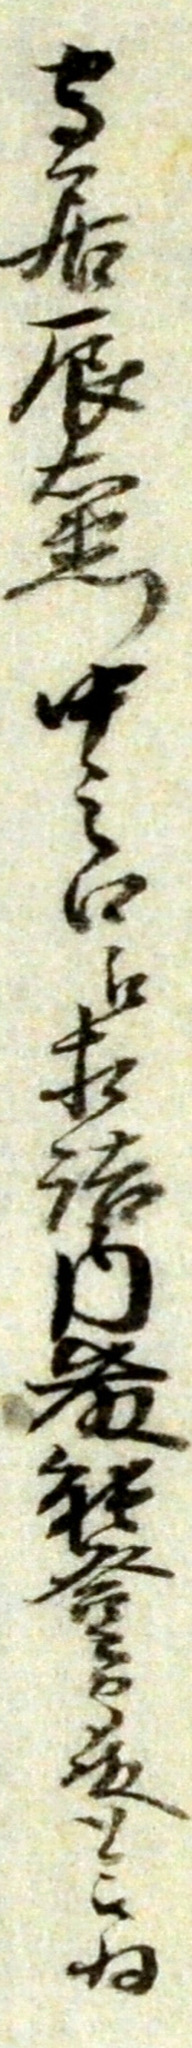守居辰右衛門中之口江相詰内藤能登守殿へも被為
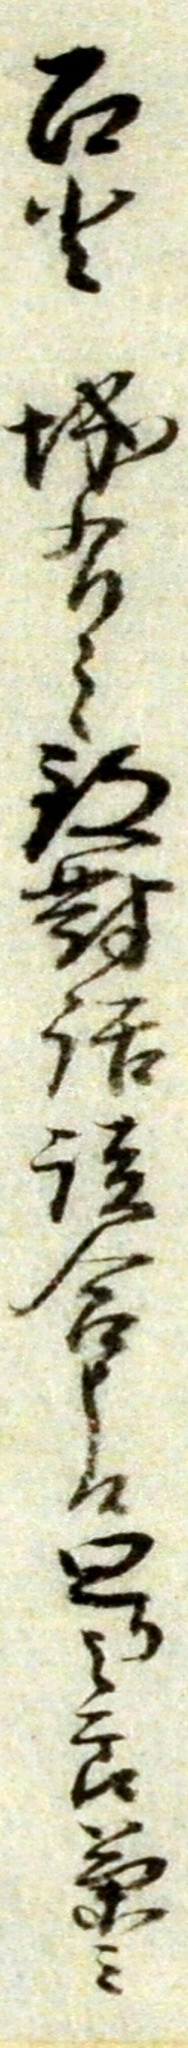召登城有之致対話談合申し候廻り之節菊之
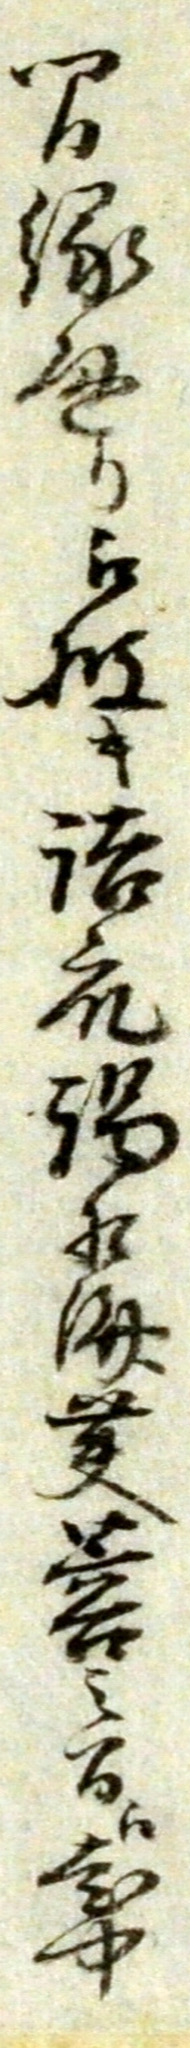間縁通り被披キ詰衆謁相済芙蓉之間老中
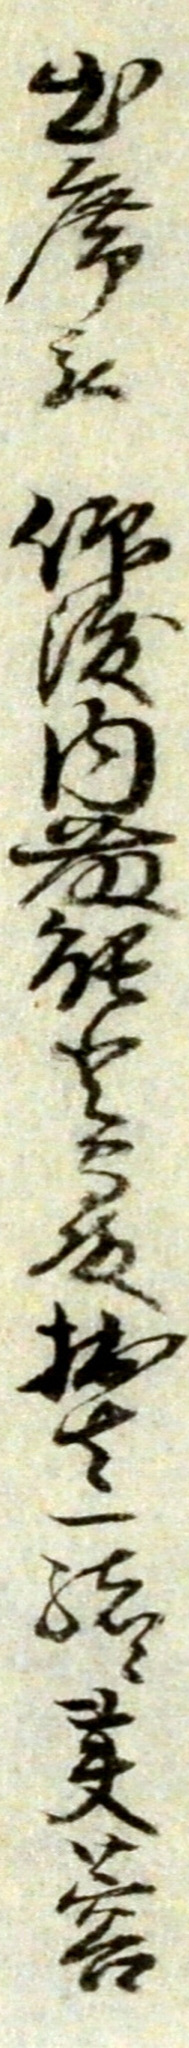出席被仰渡内藤能登守殿拙者一緒ニ芙蓉
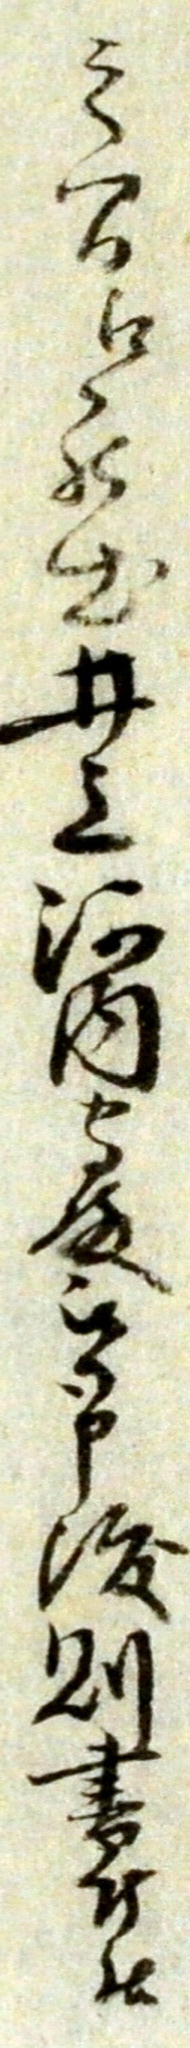之間江罷出井上河内守殿江御申渡則書付被
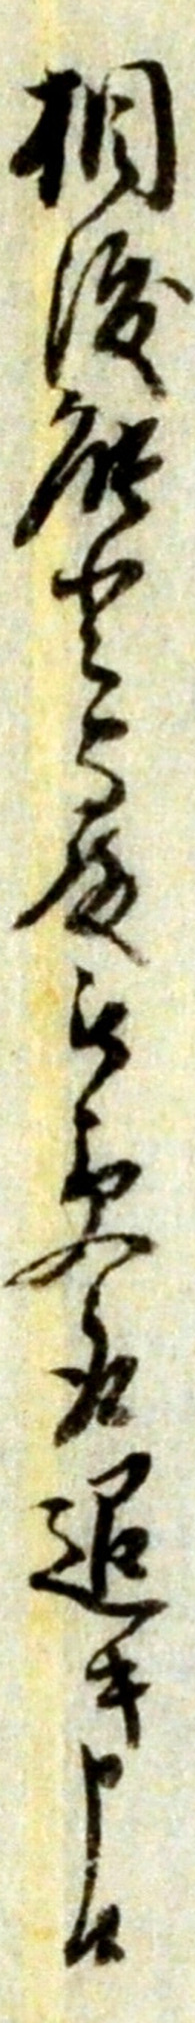相渡能登守殿被受取退キ申候
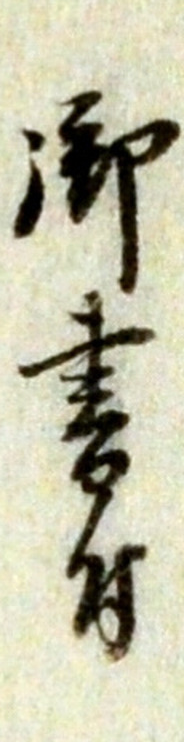御書付
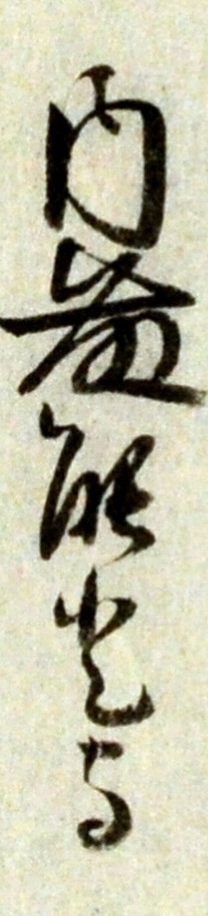土井能登守
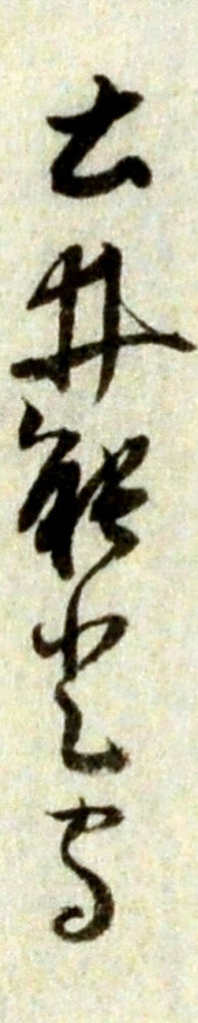土井能登守
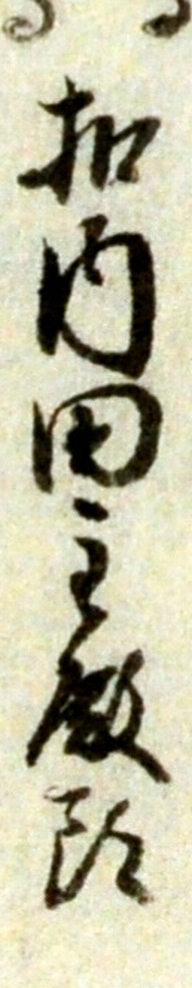扣内田主殿頭
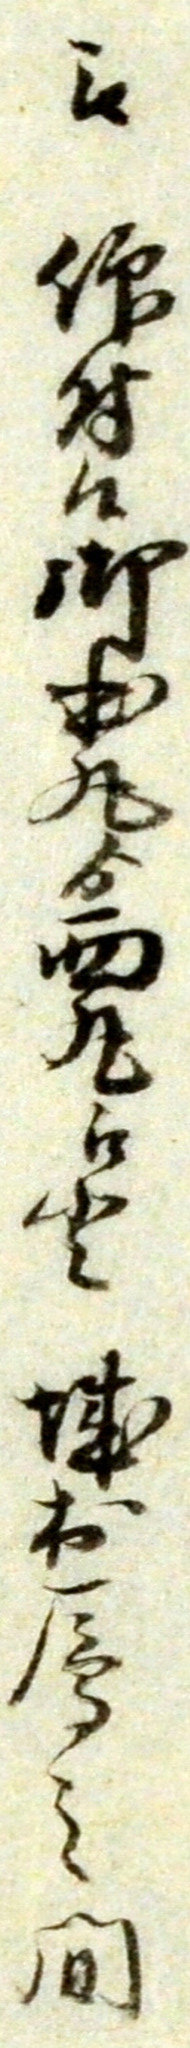被仰付候御出丸ゟ西丸江登城於雁之間
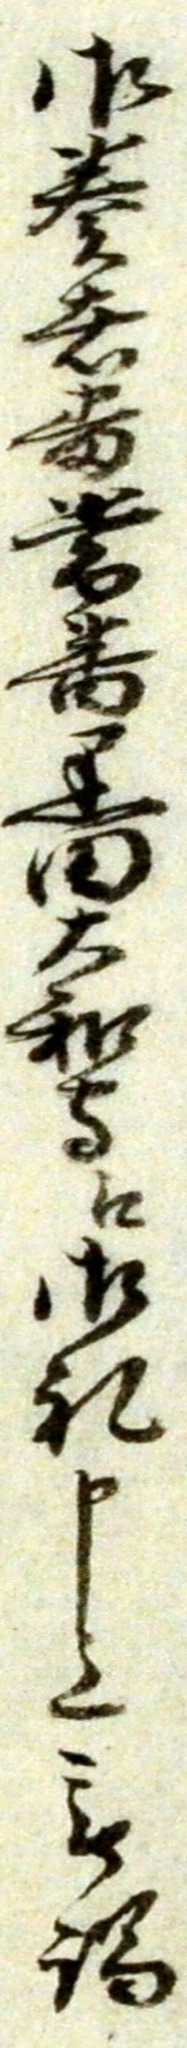御奏番常番黒田大和守江御礼申上被謁
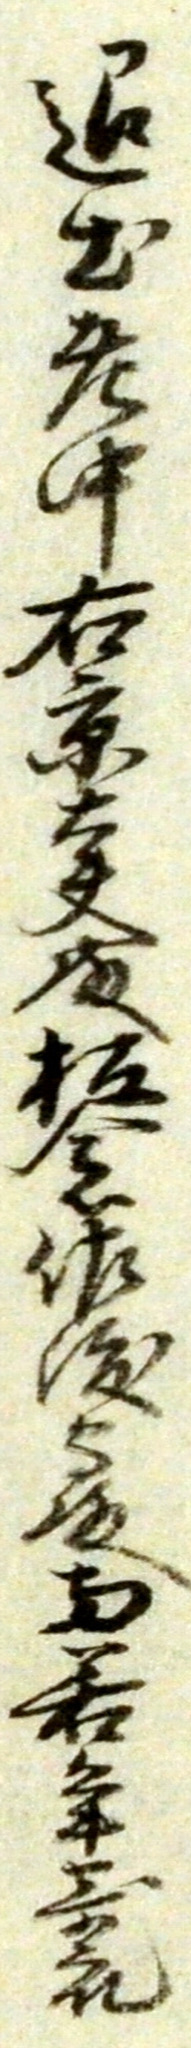退出老中右京太夫殿板倉佐渡守殿両若年寄衆
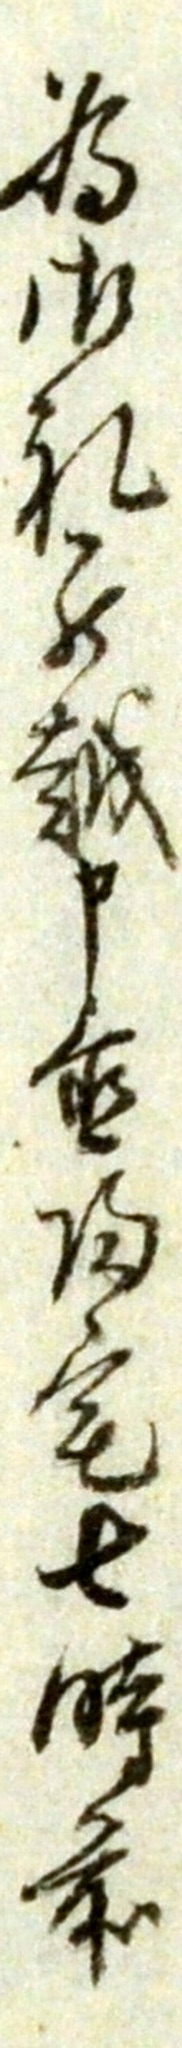為御礼罷越申置帰宅七時前
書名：日光御名代相勤候節ノ留
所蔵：伊那市立高遠町図書館・合同会社AMANE
